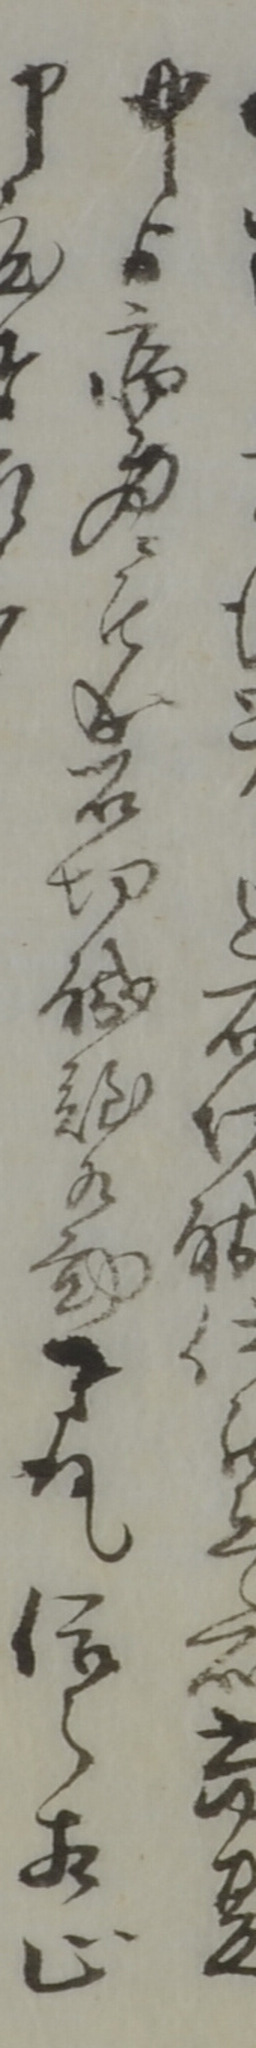中ゟ病身ニ罷成石切職難相勤奉存候依之相止
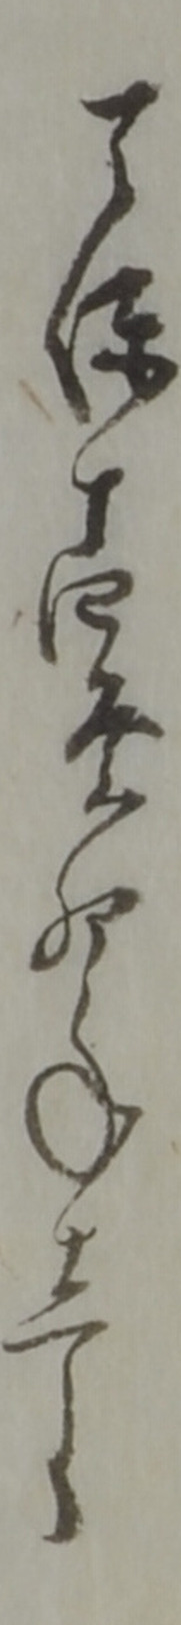天保十四癸卯年十二月
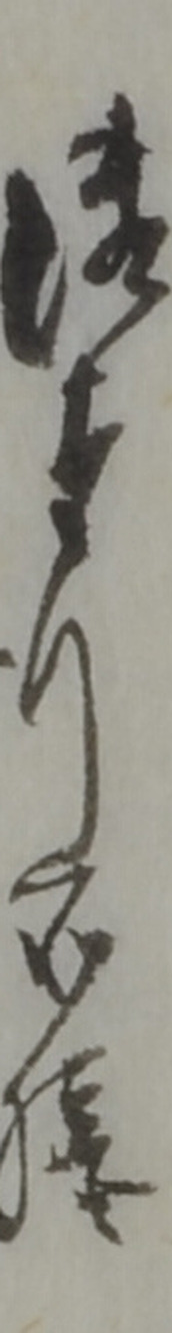御奉行所様
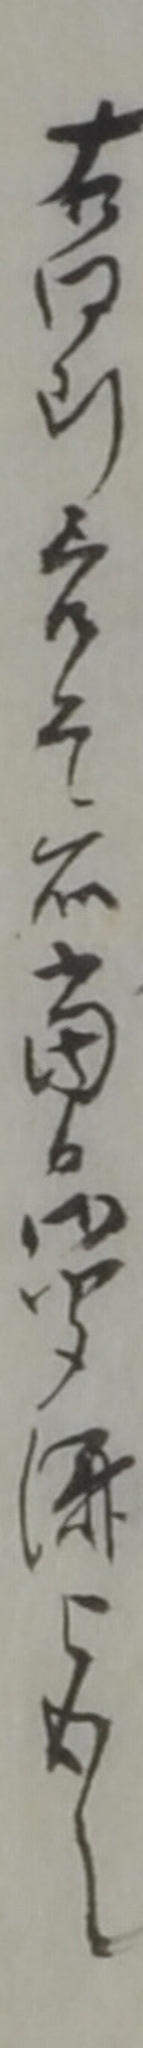右同断差上候所当日御聞済被成候
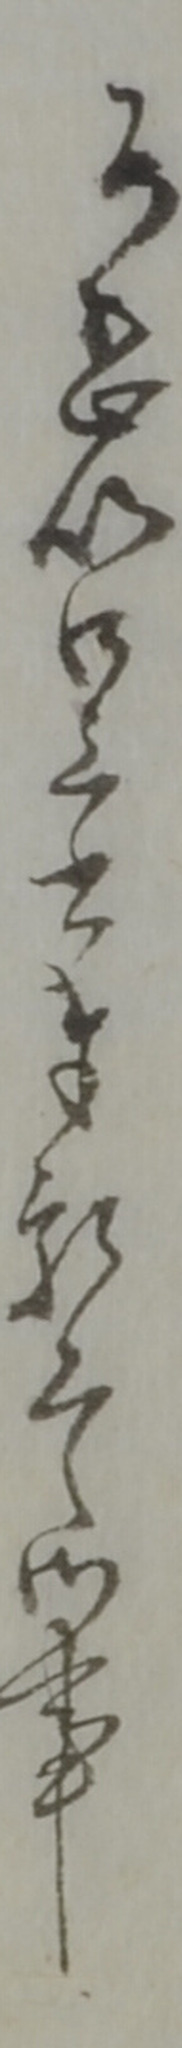乍恐以口上書奉願上候御事
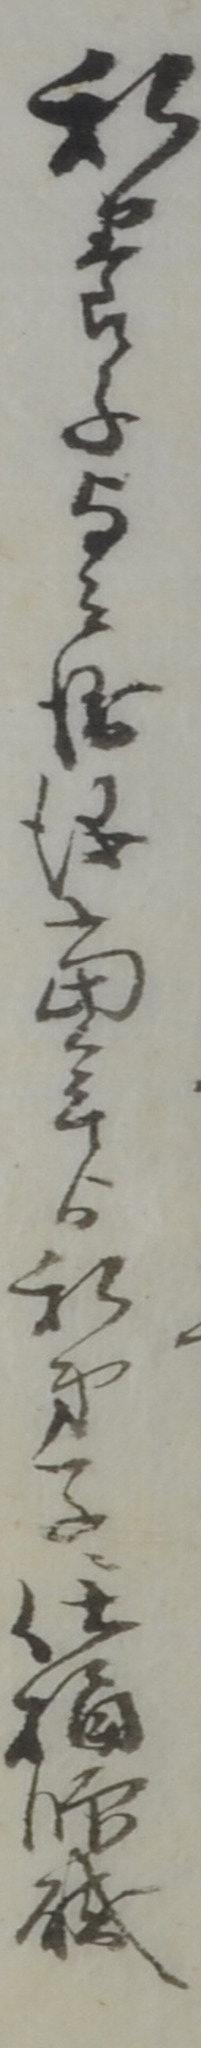私養子与兵衛儀当年ゟ私弟子ニ仕桶師職

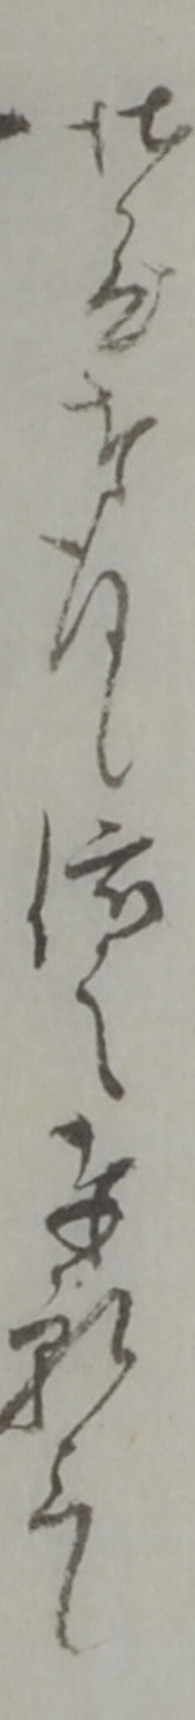仕度奉存候依之奉願上候
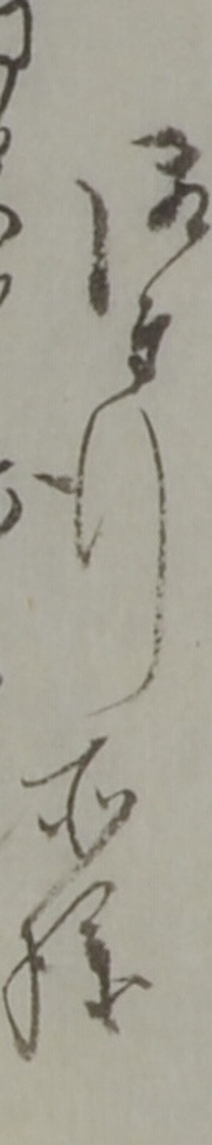御奉行所様
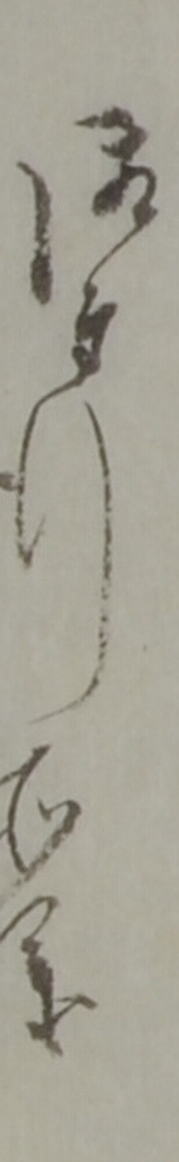御奉行所様
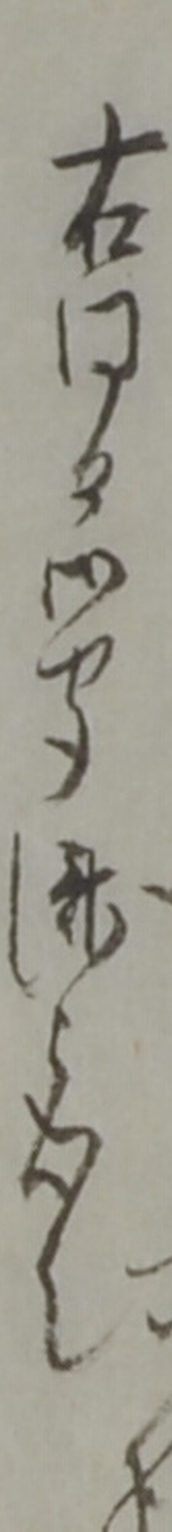右同日御聞済被成候
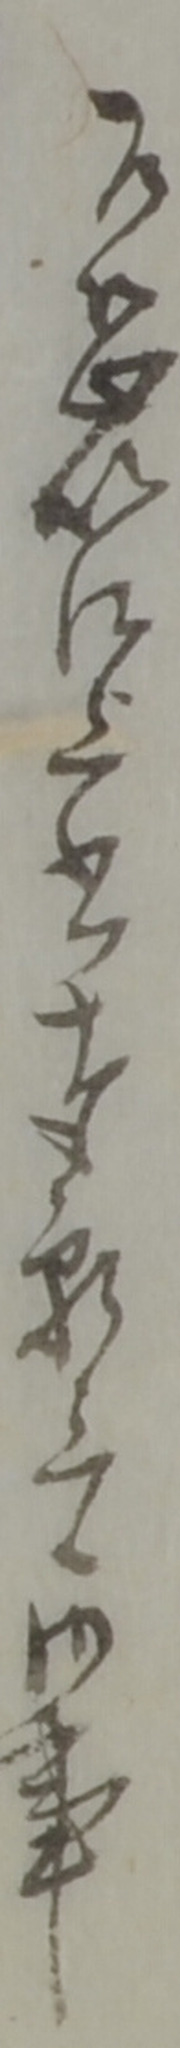乍恐以口上書奉願上候御事
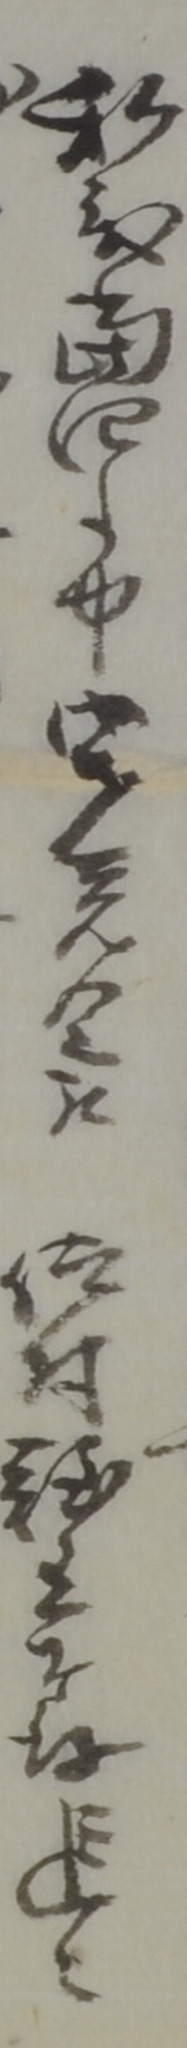私義当四月中御才覚金被仰付難有奉存追々
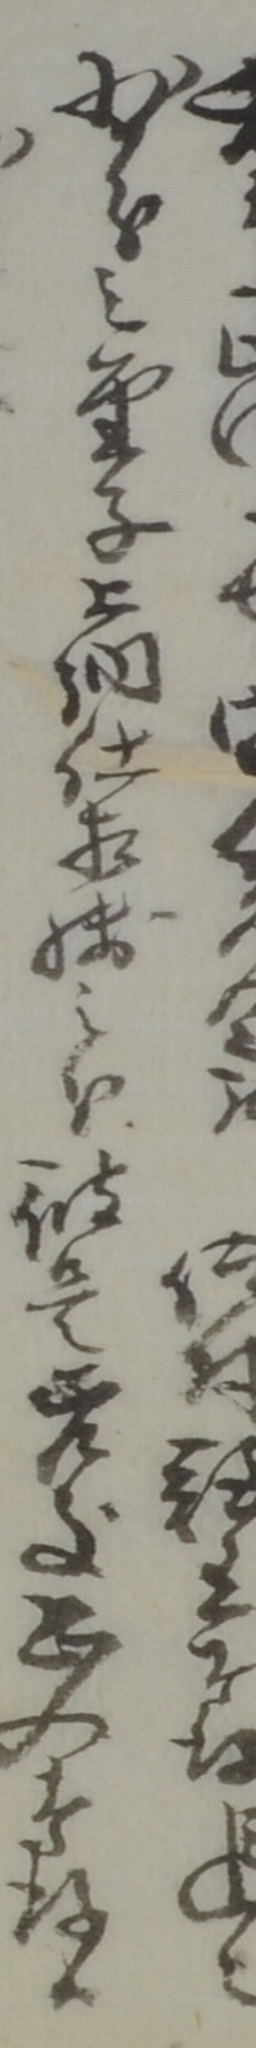少分之金子上納仕相残之分彼是差支恐入奉存候
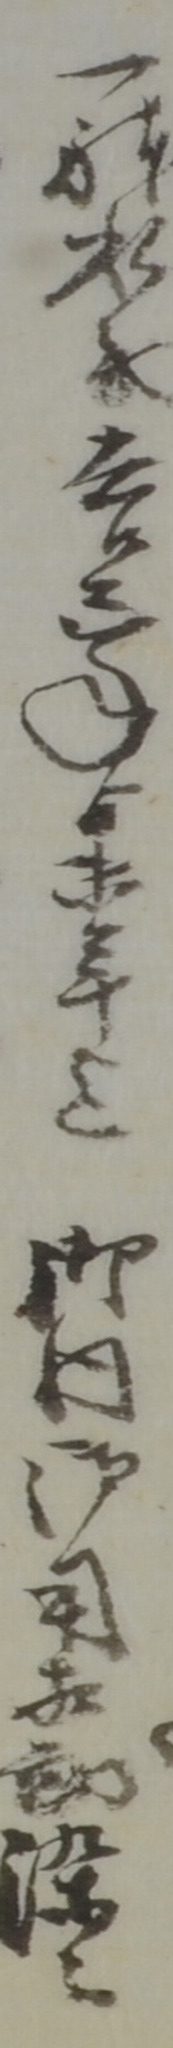一体私義去ル巳年ゟ未年迄御内御用相勤染之
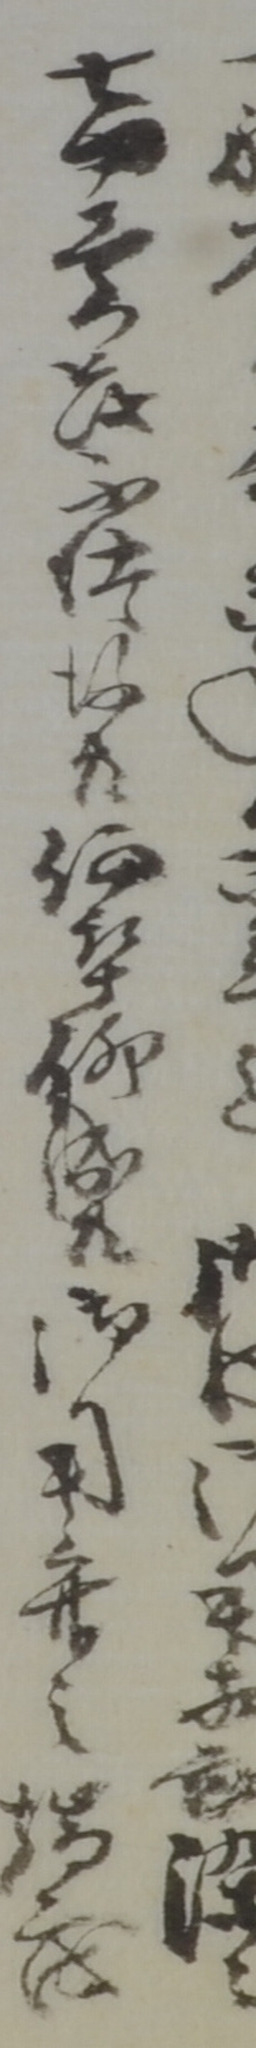商売も不仕候得共何卒聊成共御用弁之端も
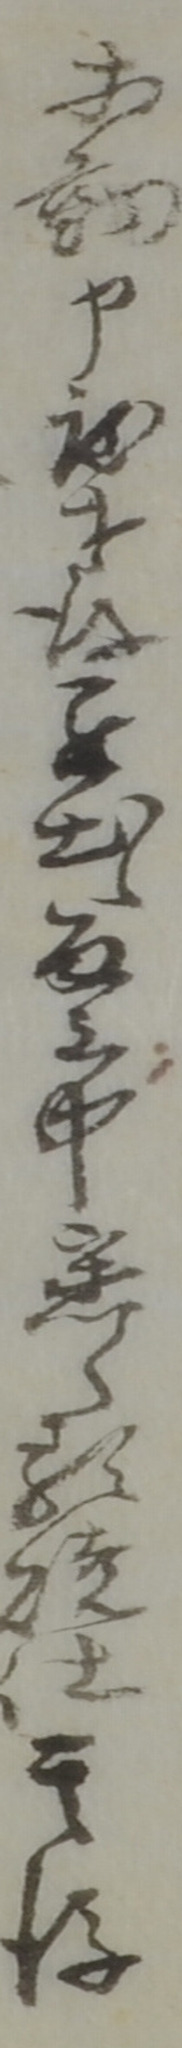相勤申度奉存罷出候立中悉く類焼仕其後
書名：諸願書控簿
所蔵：伊那市立高遠町図書館・合同会社AMANE
